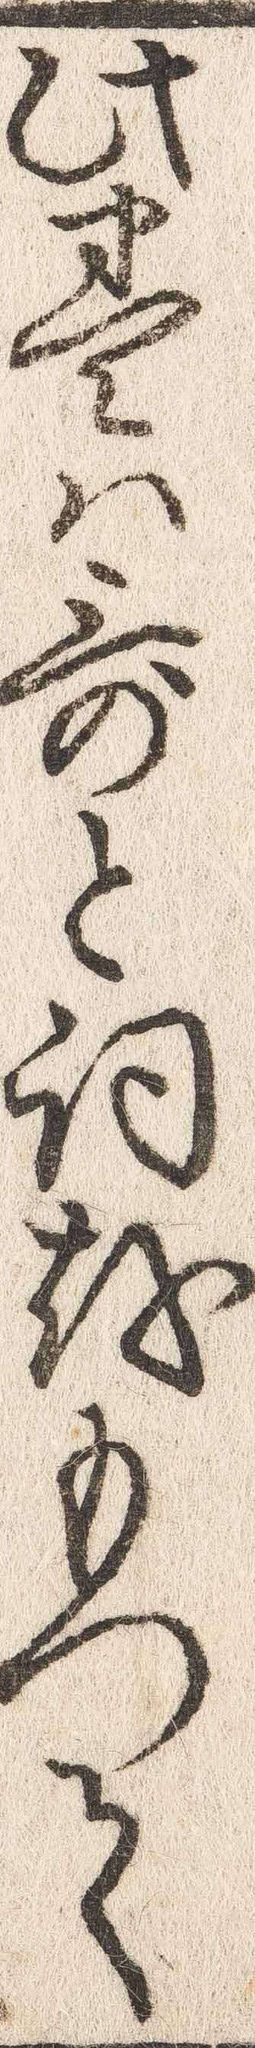此巻は歌と詞をもつて
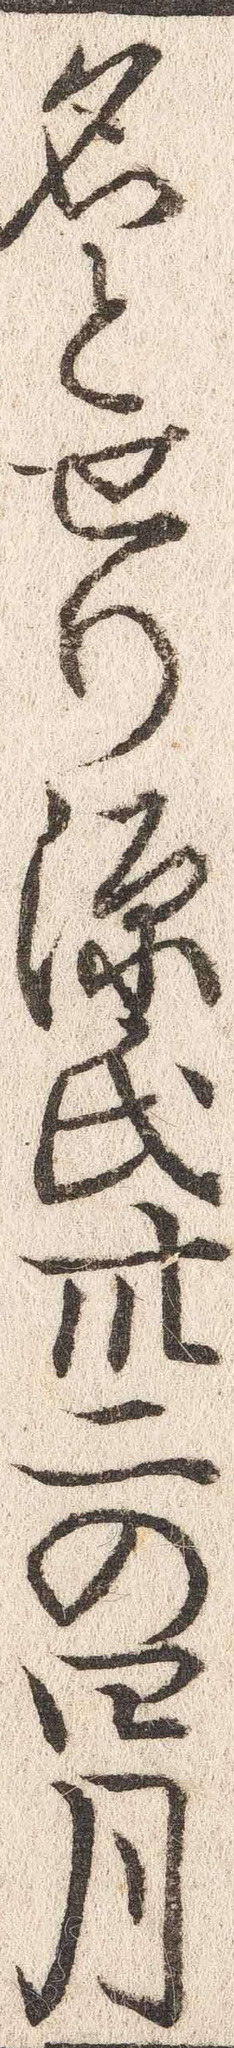名とせり源氏卅二の四月
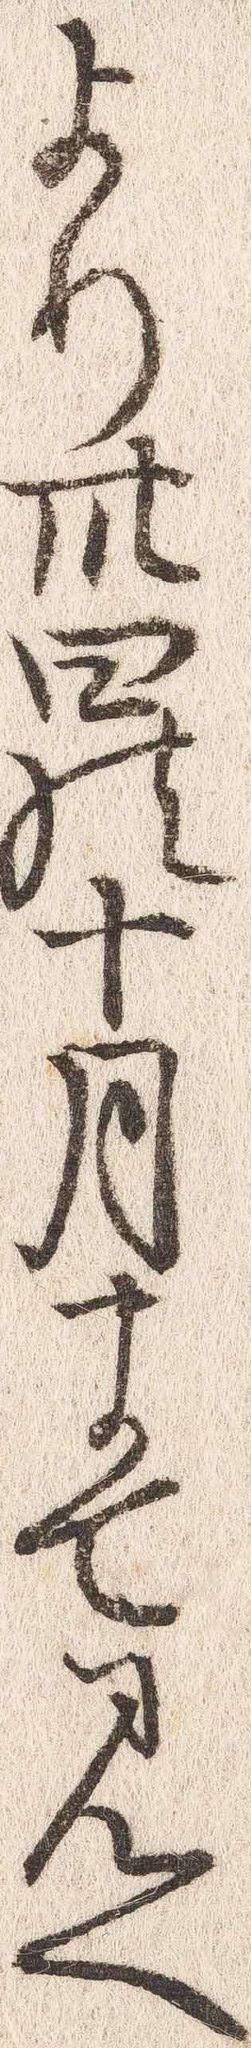より卅四の十月まて見へ
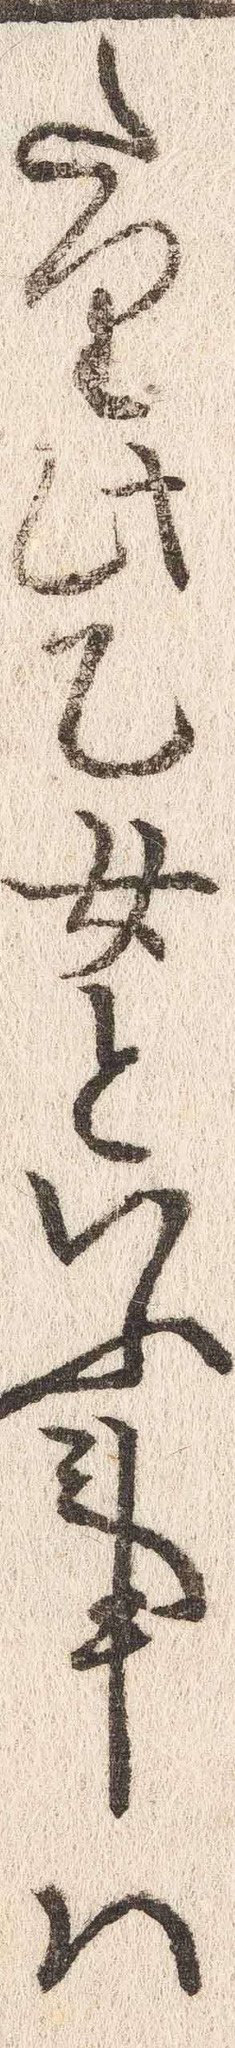たり此乙女といふ事は
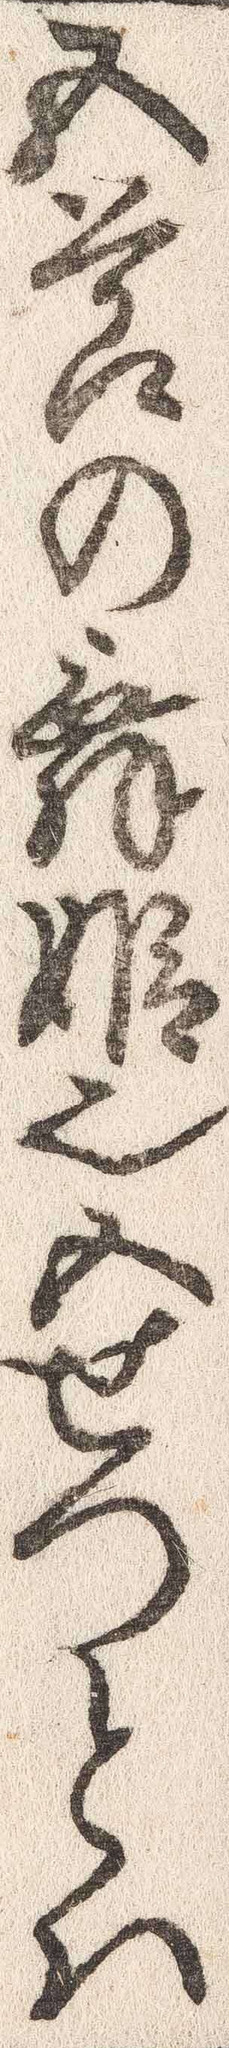五節の舞姫也五せつとは
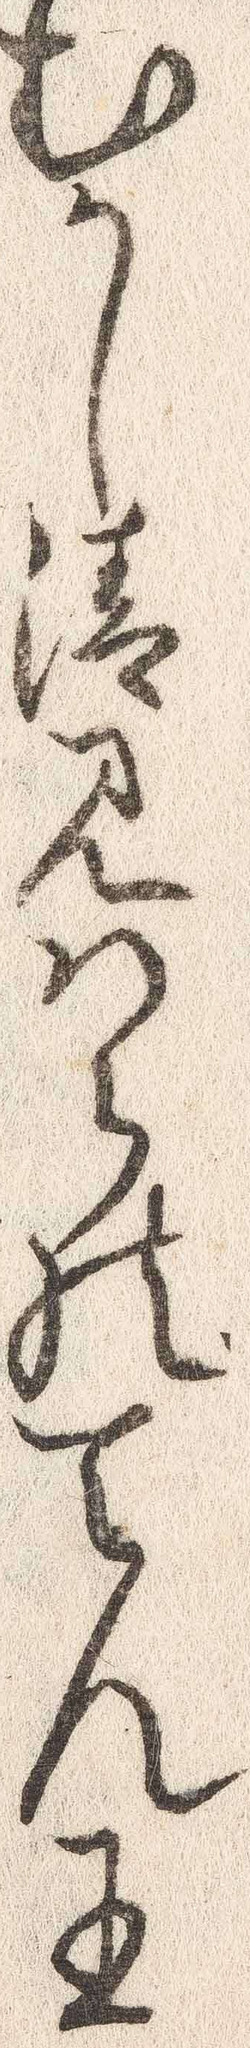むかし清見はらのてん王
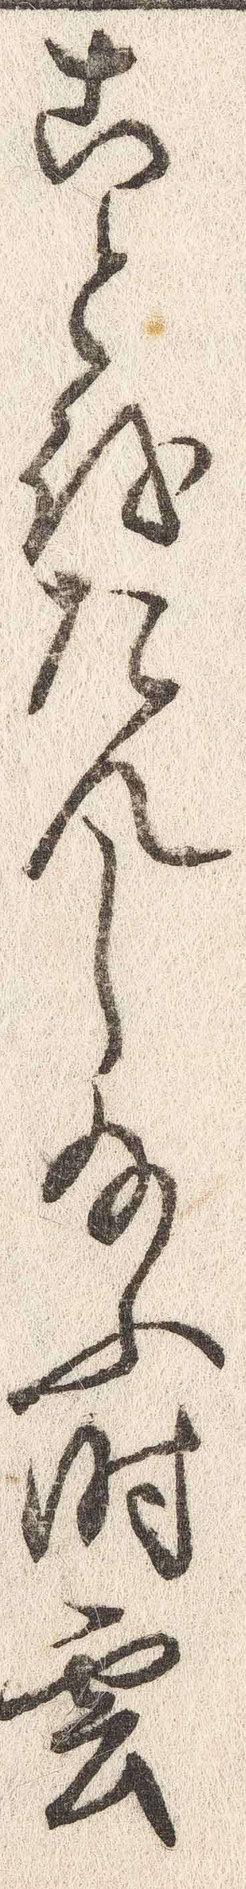ことをたんし給ふ時雲
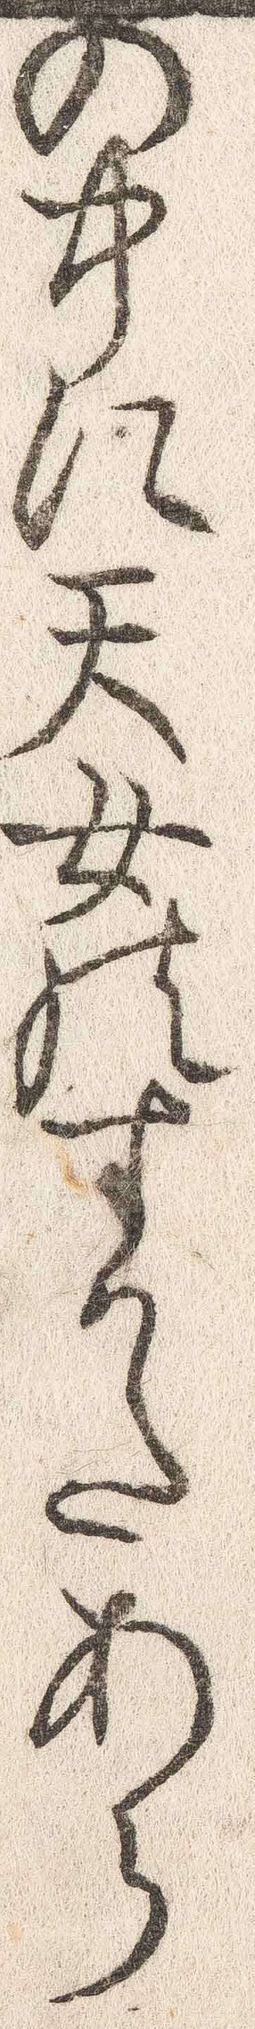の中に天女のすかたあら
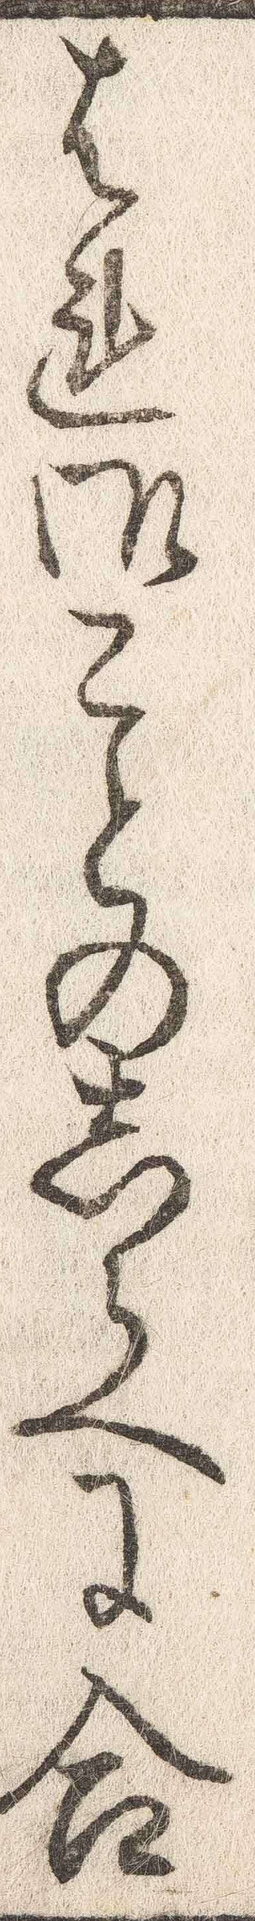はれ御ことのしらへに合

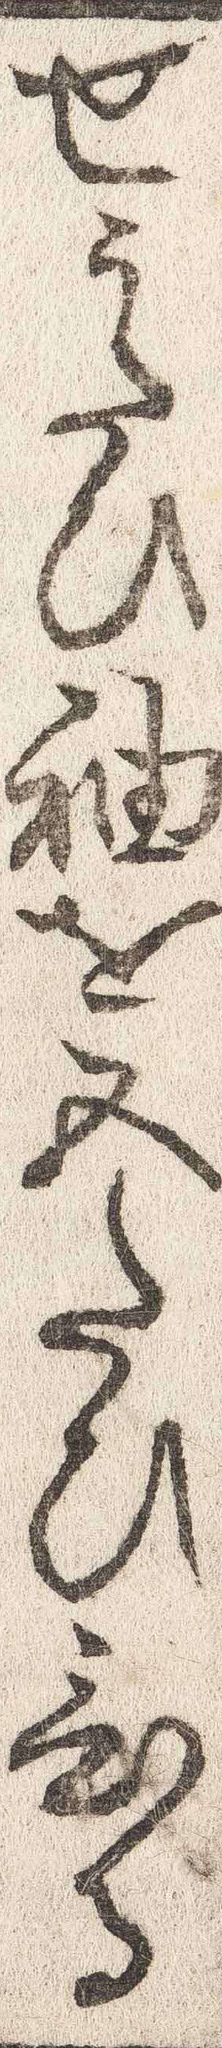せうたひ袖を五たひひる
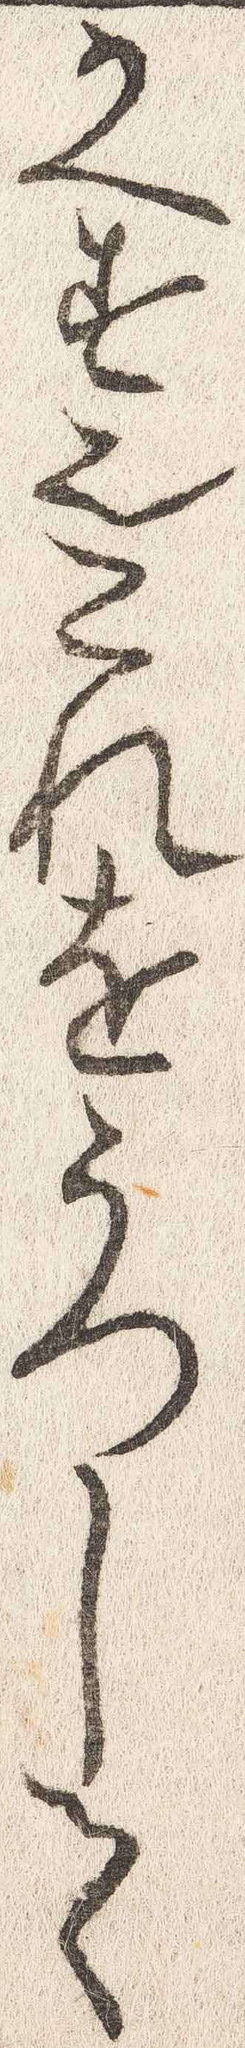かへす也これをうつして
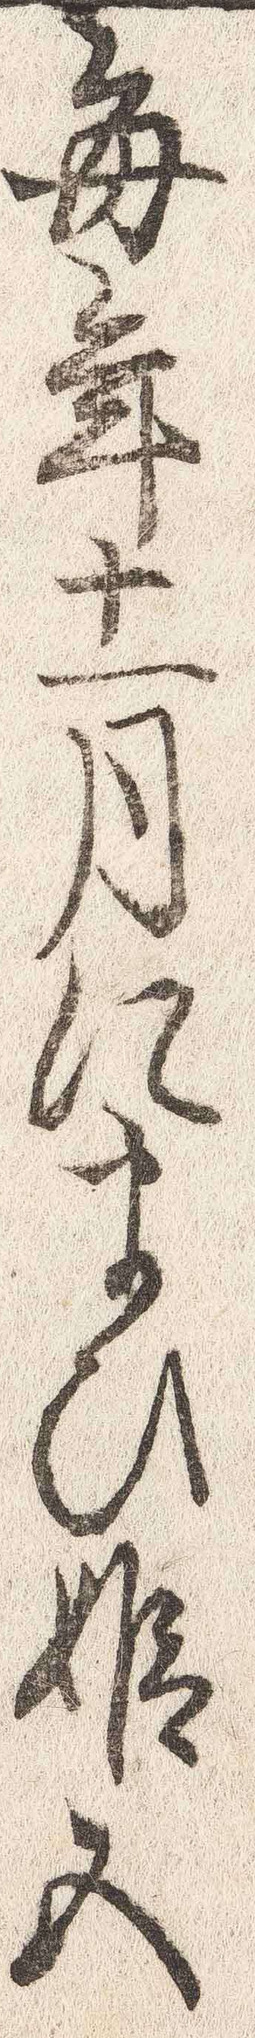毎年十一月にまひ姫五
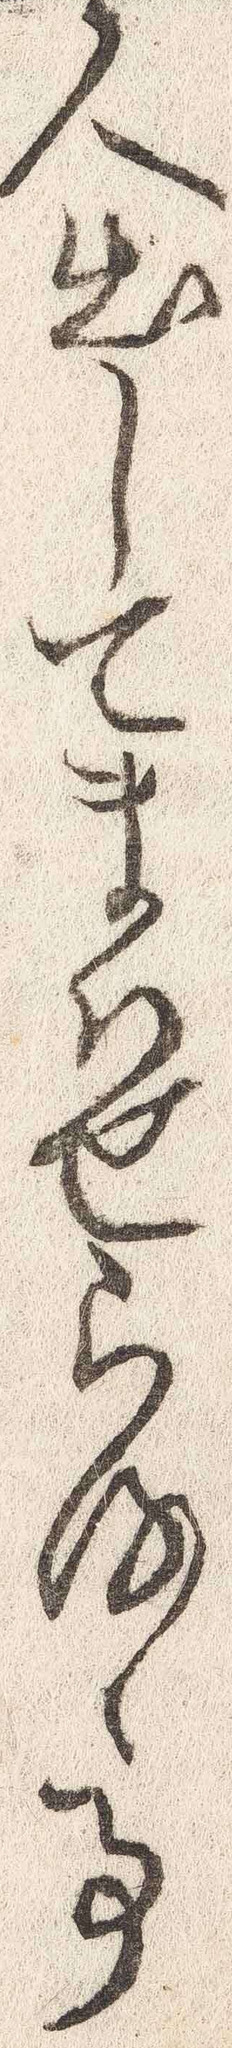人出してまはせらるゝ事
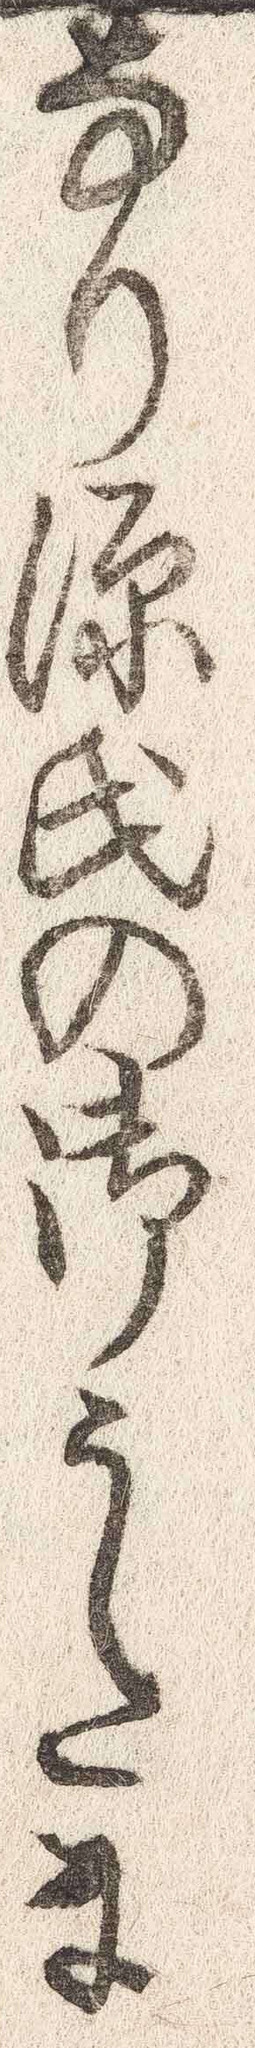なり源氏の御うたに
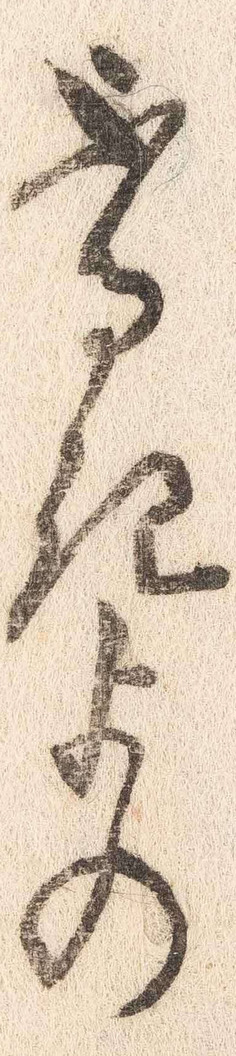ふるきよの
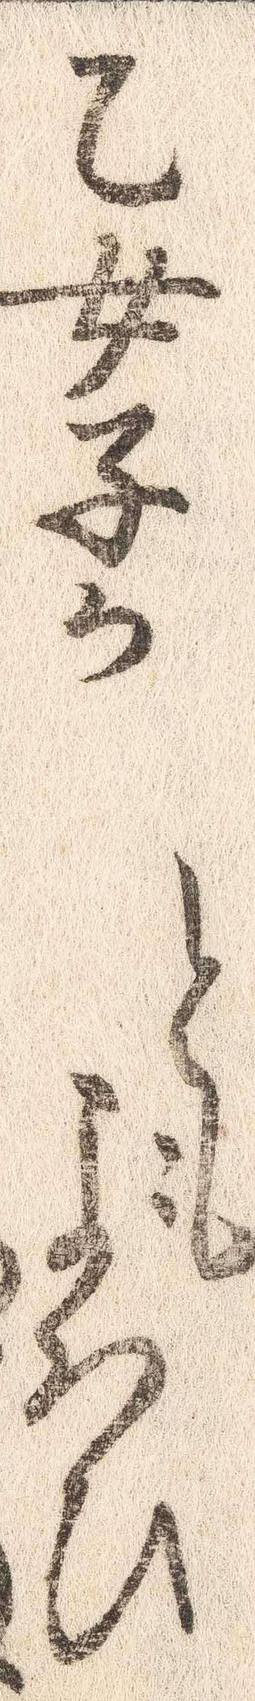乙女子かよはひ
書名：源氏物語
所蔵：東京学芸大学附属図書館 国文学研究資料館
